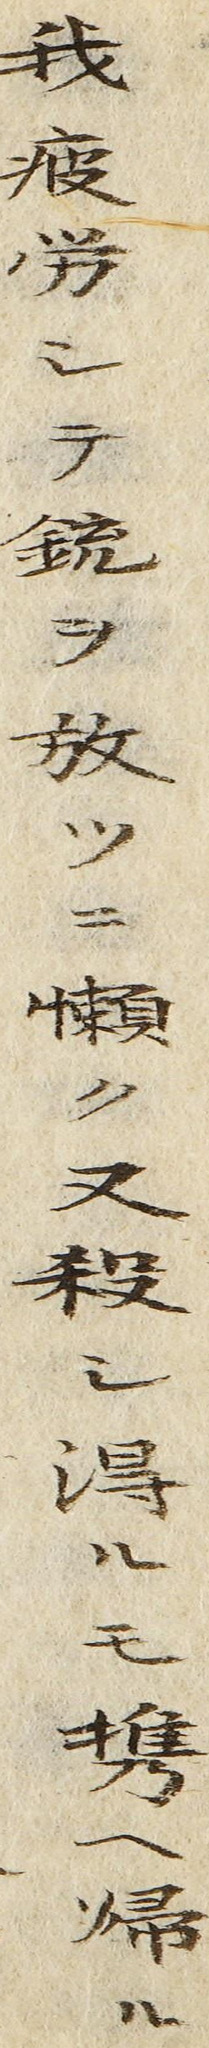我疲労シテ銃ヲ放ツニ懶ク又殺シ得ルモ携ヘ帰ル
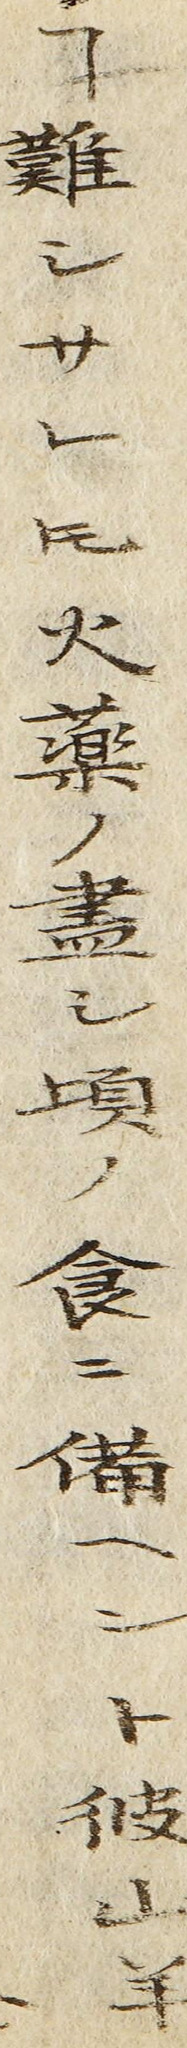コト難シサレトモ火薬ノ尽シ頃ノ食ニ備ヘント彼山羊
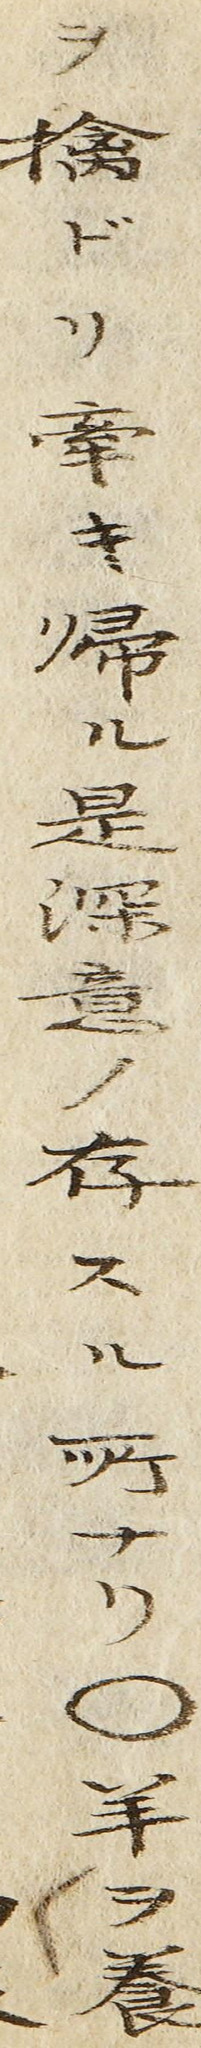ヲ擒ドリ牽キ帰ル是深意ノ存スル所ナリ◯羊ヲ養
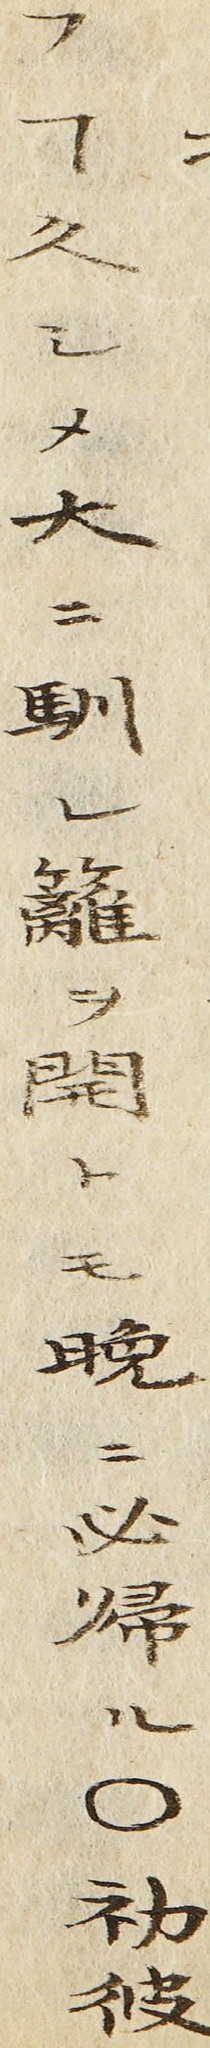フコト久シシテ大ニ馴レ籬ヲ開トモ晩ニ必帰ル◯初彼
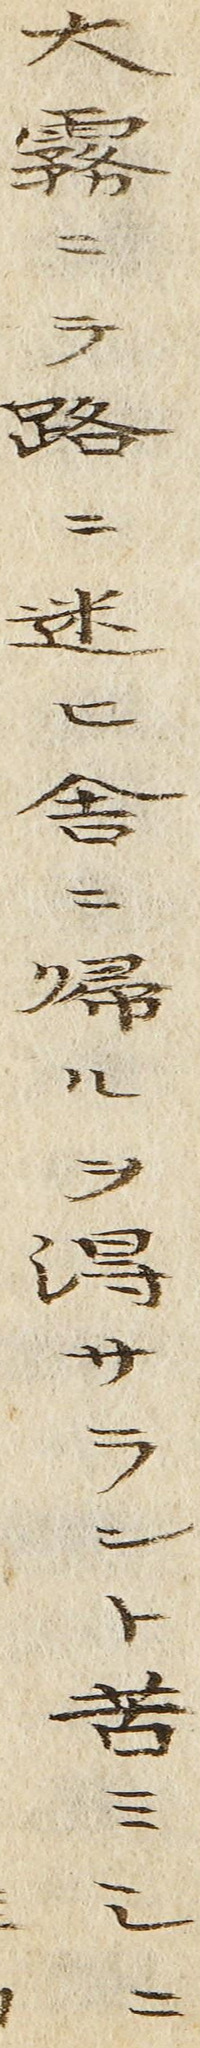大霧ニテ路ニ迷ヒ舎ニ帰ルヲ得サラント苦ミシニ
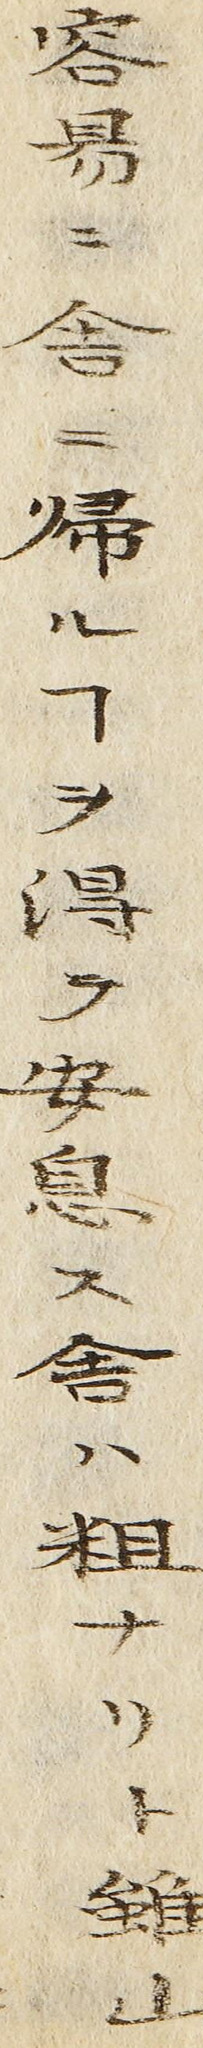容易ニ舎ニ帰ルコトヲ得テ安息ス舎ハ粗ナリト雖山
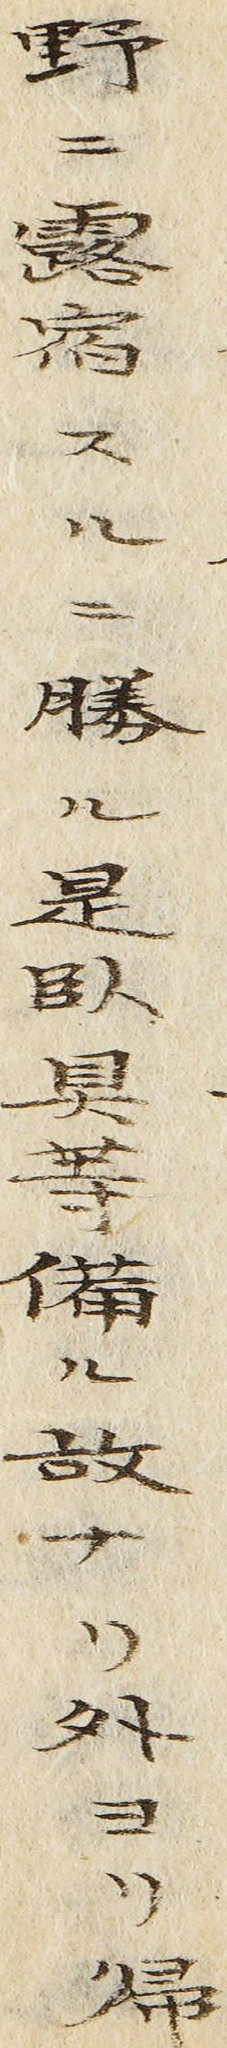野ニ露宿スルニ勝ル是臥具等備ル故ナリ外ヨリ帰
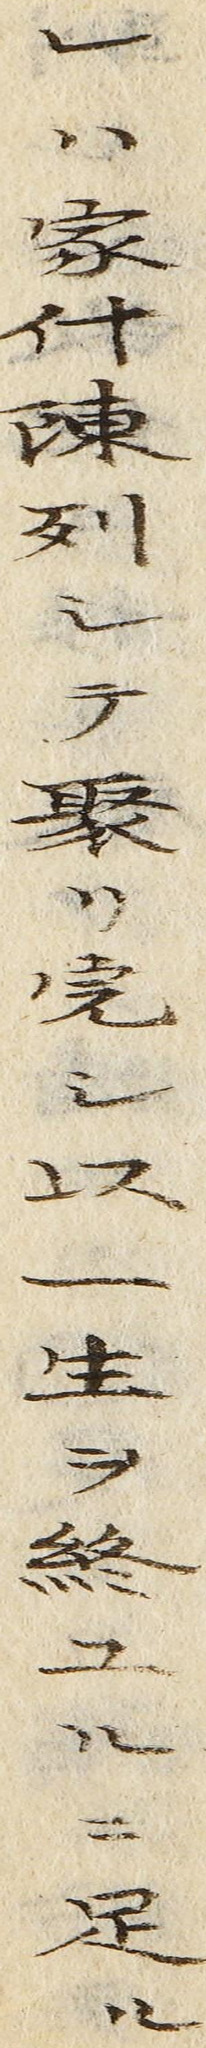レハ家什陳列シテ聚リ完シ以一生ヲ終ユルニ足ル
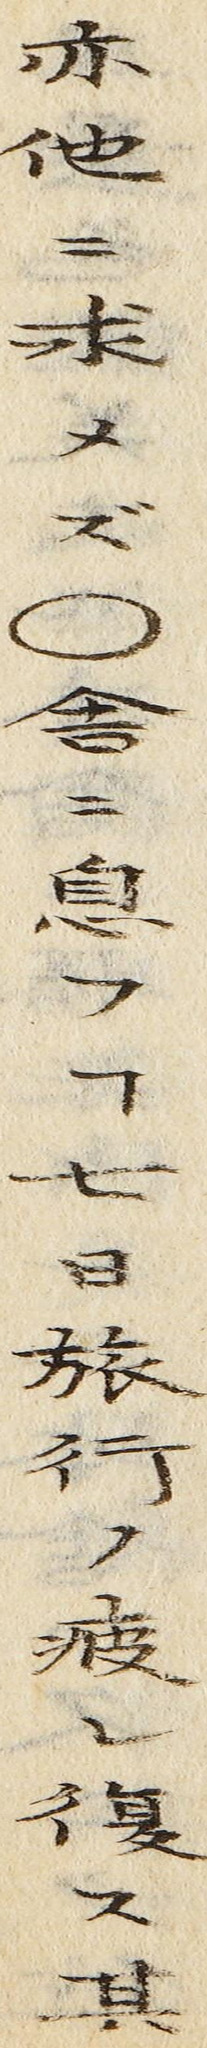亦他ニ求メズ◯舎ニ息フコト七日旅行ノ疲レ復ス其
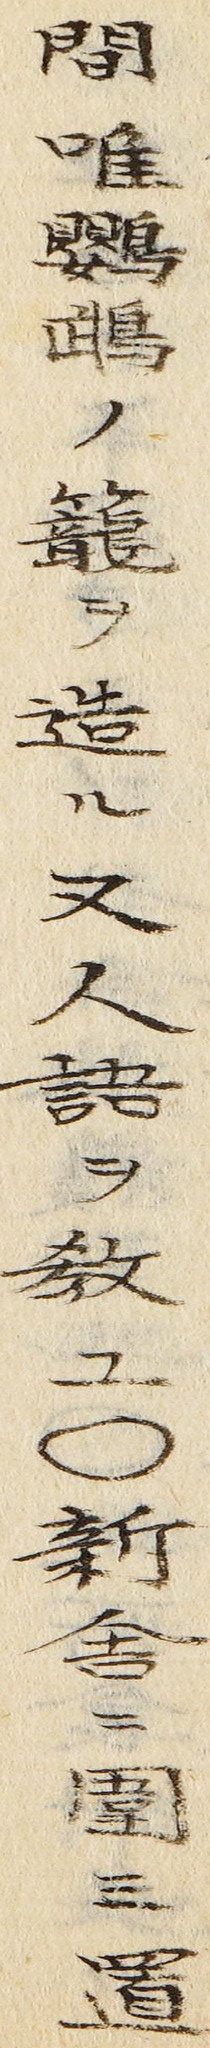間唯鸚鵡ノ籠ヲ造ル又人語ヲ教ユ◯新舎ニ囲ミ置
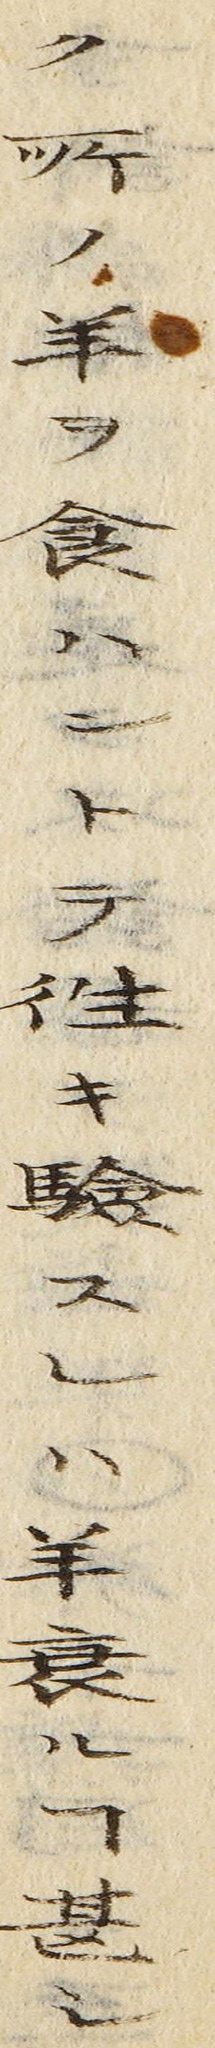ク所ノ羊ヲ食ハントテ往キ験スレハ羊衰ルコト甚シ
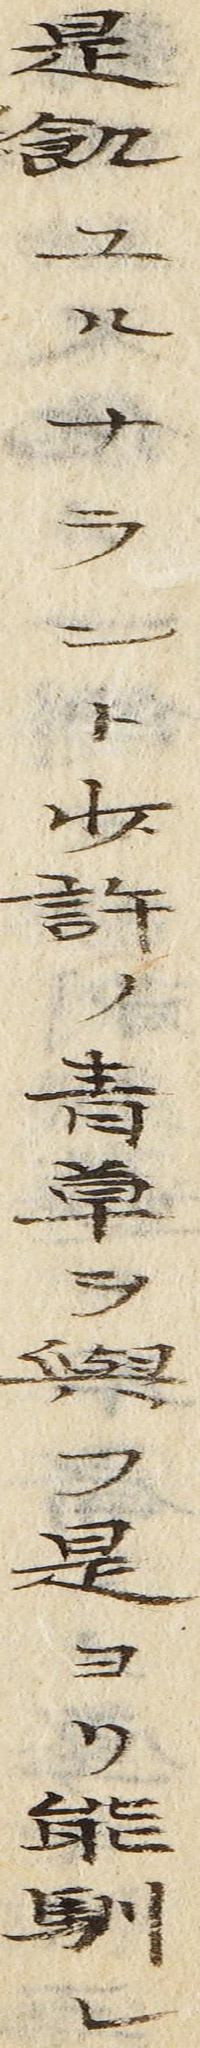是飢ユルナラント少許ノ青草ヲ与フ是ヨリ能馴レ
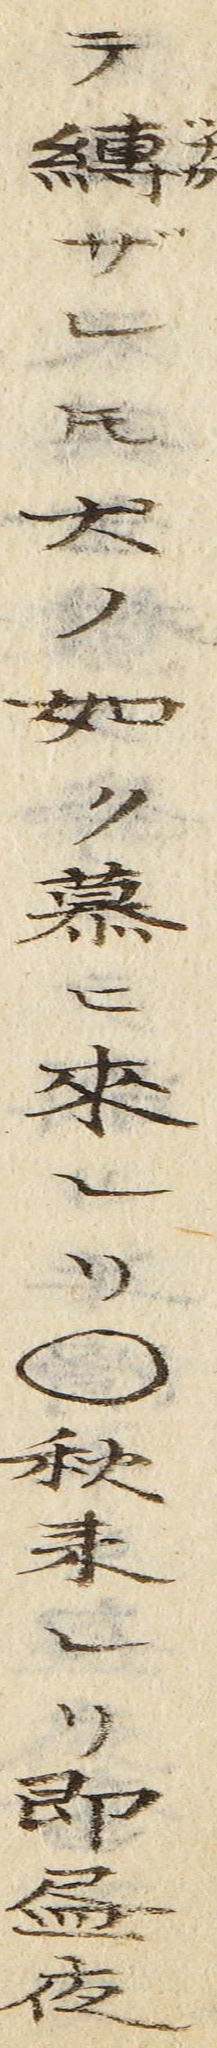テ縛ザレトモ犬ノ如ク慕ヒ来レリ◯秋来レリ即昼夜
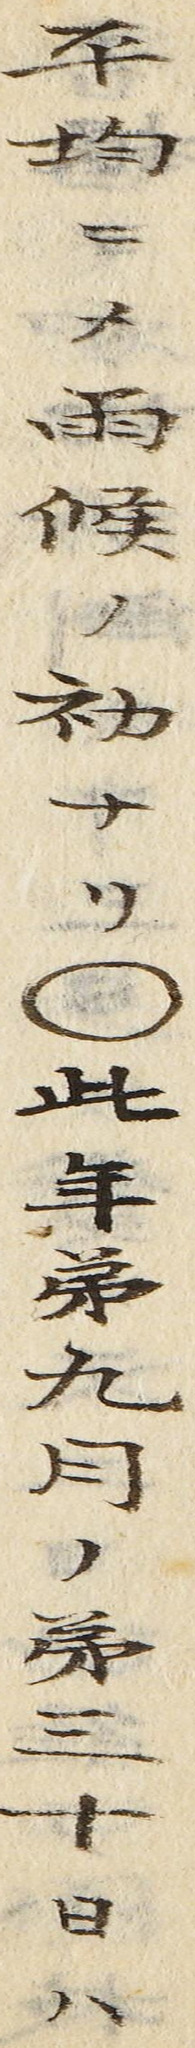平均ニシテ雨候ノ初ナリ◯此年第九月ノ第三十日ハ
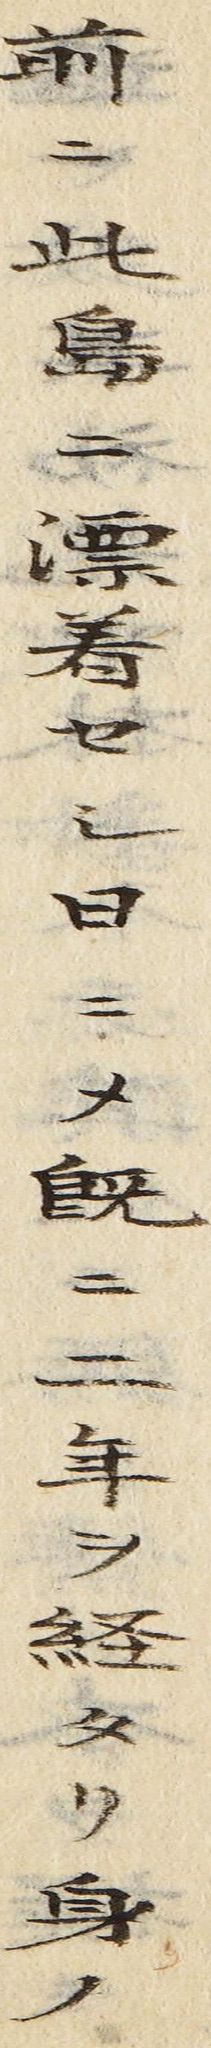前ニ此島ニ漂着セシ日ニシテ既ニ二年ヲ経タリ身ノ
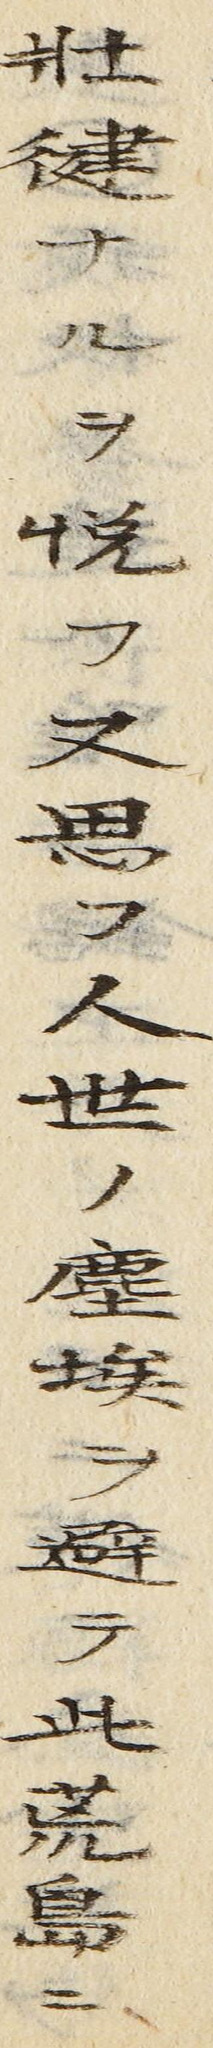壮健ナルヲ悦フ又思フ人世ノ塵埃ヲ避テ此荒島ニ
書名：漂流紀事
